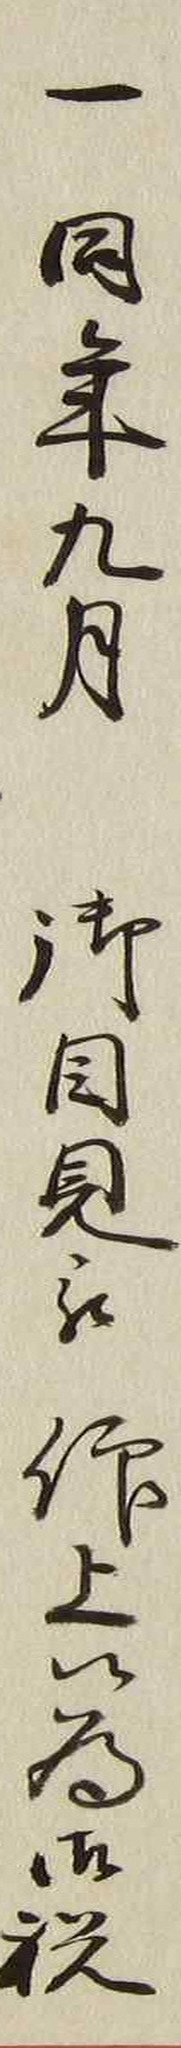一同年九月御目見被仰上候為御祝
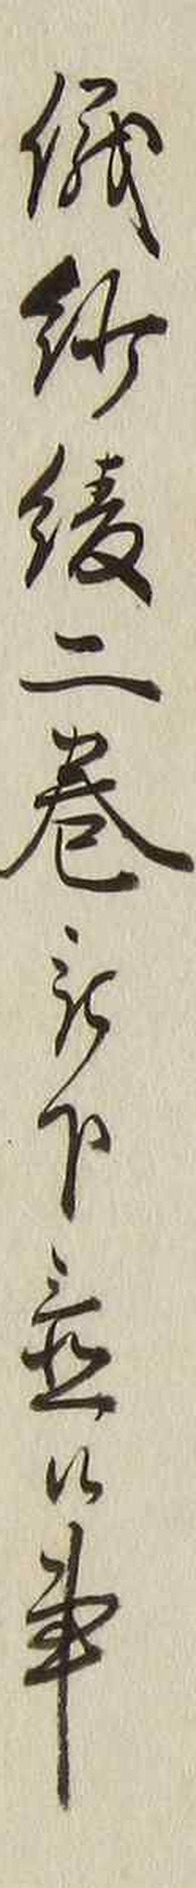儀紗綾二巻被下置候事
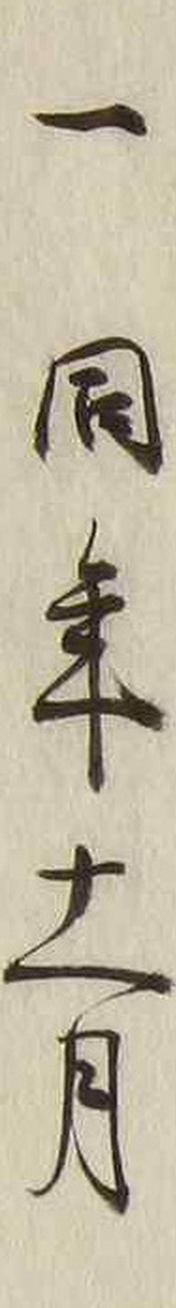一同年十一月

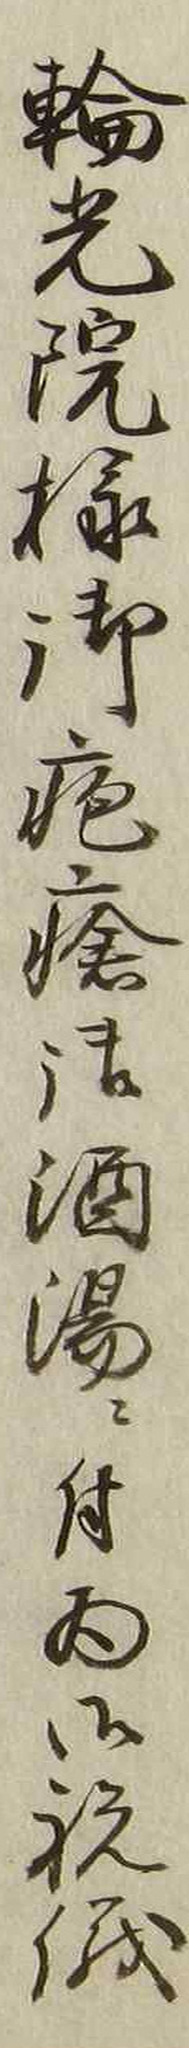輪光院様御疱瘡御酒湯ニ付為御祝儀
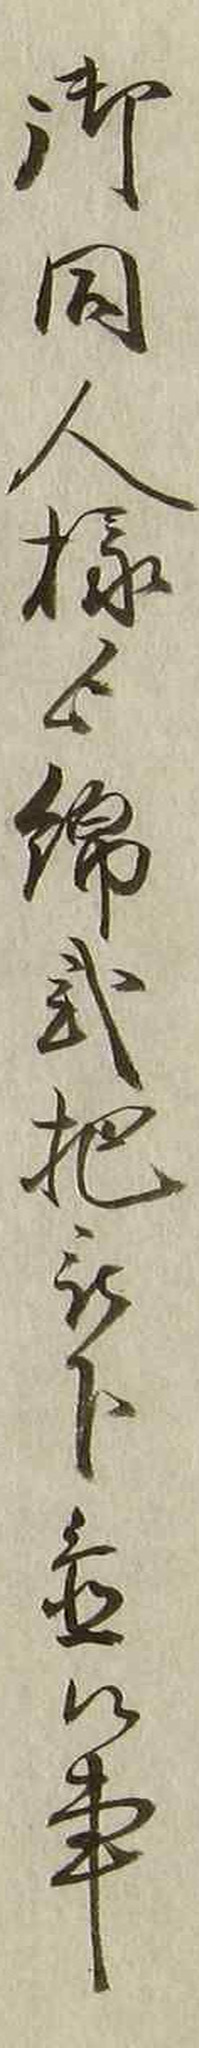御同人様ゟ綿弐杷被下置候事
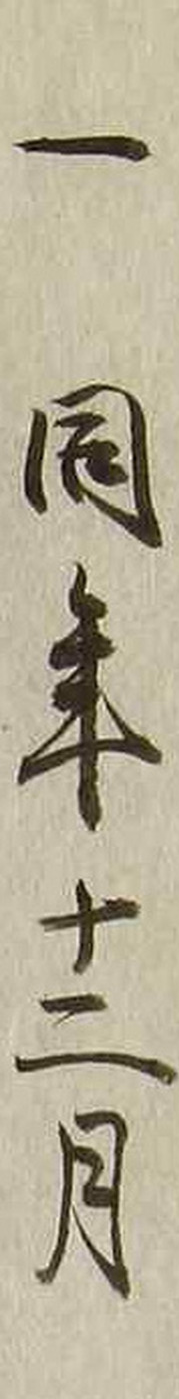一同年十二月
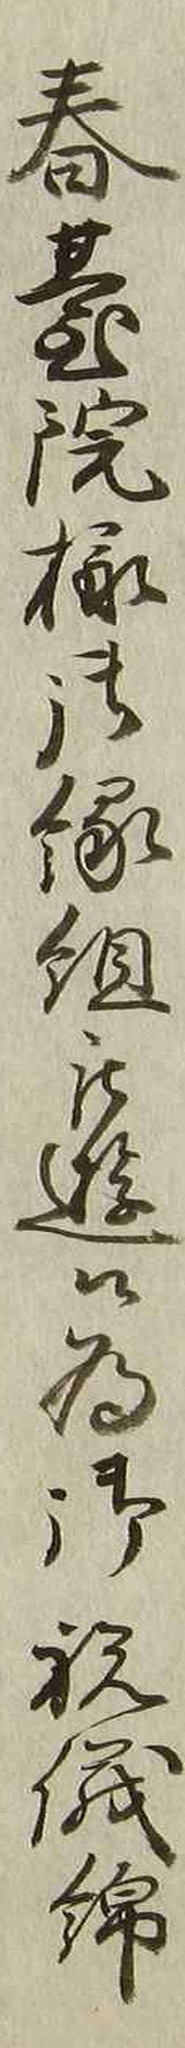春台院様御縁組被遊候為御祝儀綿
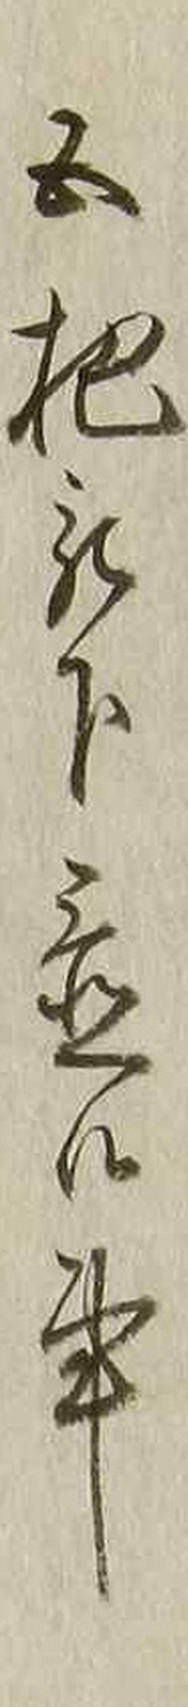五杷被下置候事
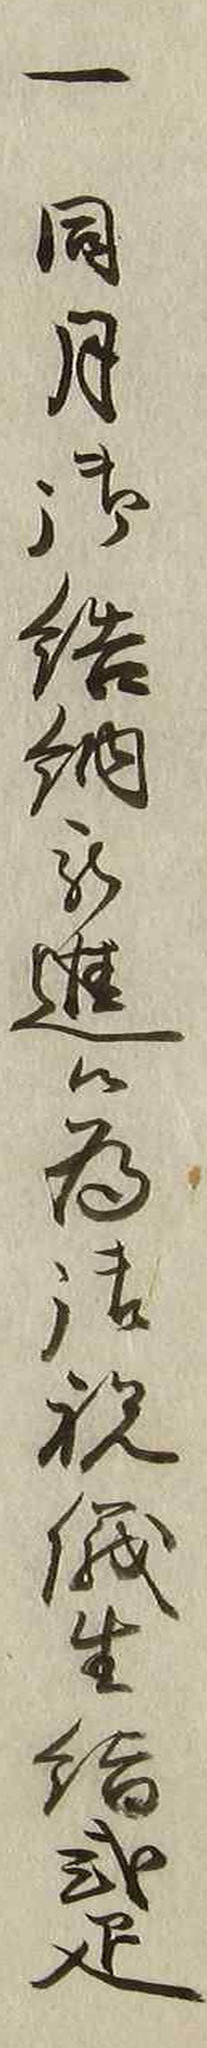一同月御結納被進候為御祝儀生絹弐疋
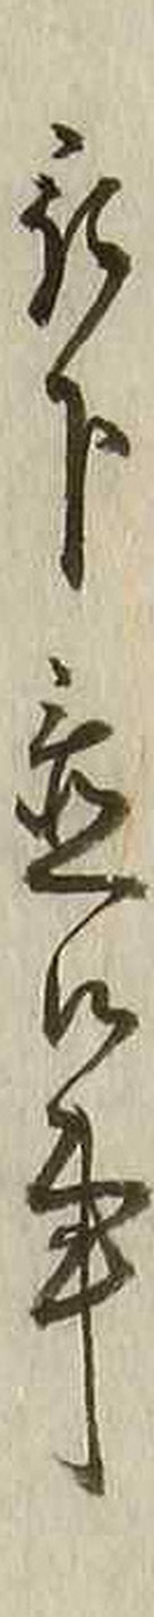被下置候事
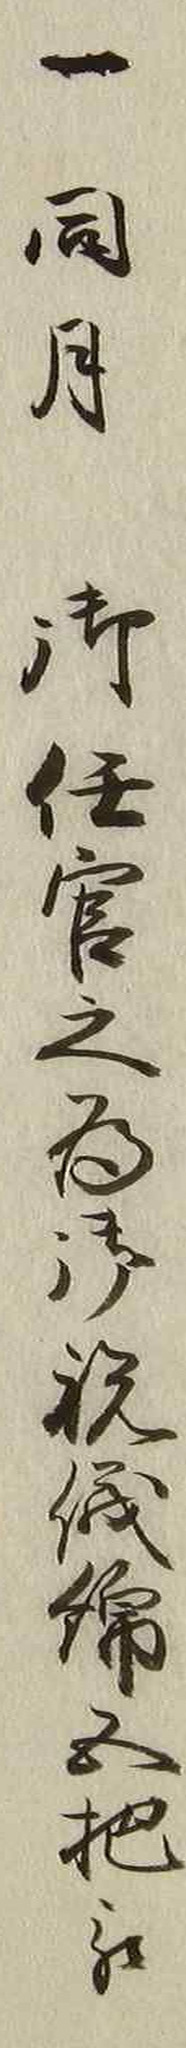一同月御任官之為御祝儀綿五杷被
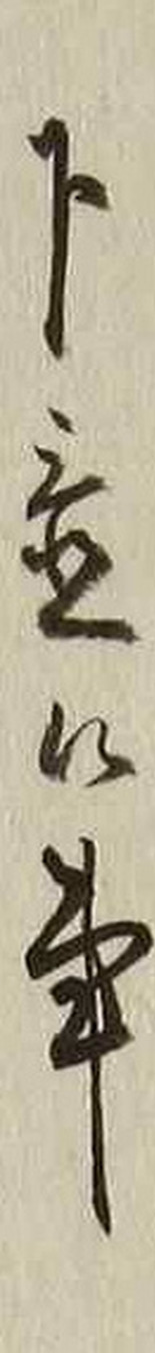下置候事
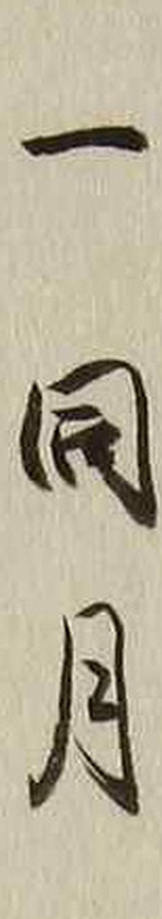一同月
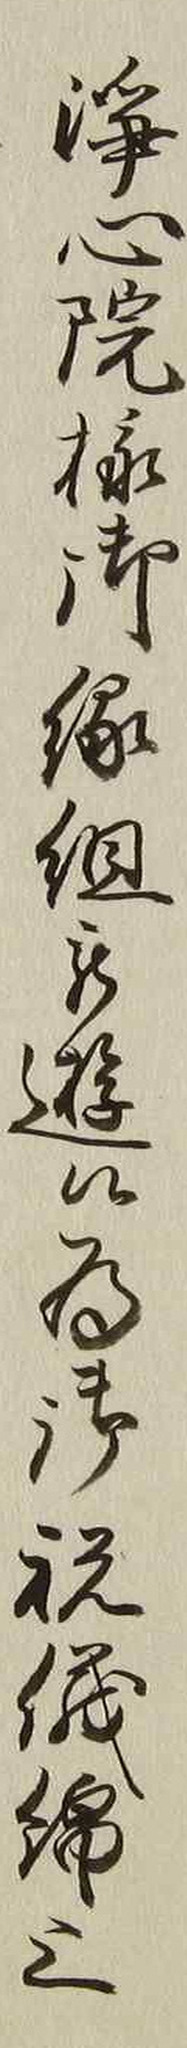浄心院様御縁組被遊候為御祝儀綿三
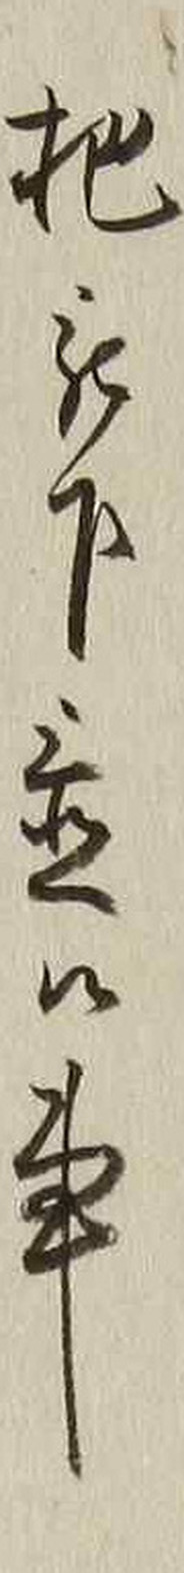綿三把被下置候事
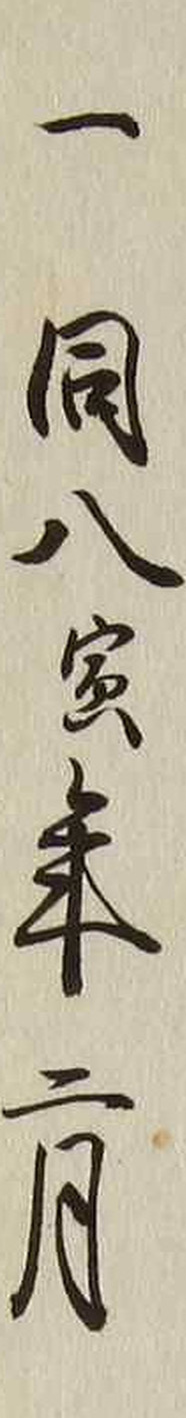一同八寅年二月
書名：諸士系譜　巻之15　い之部15
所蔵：会津若松市立会津図書館
